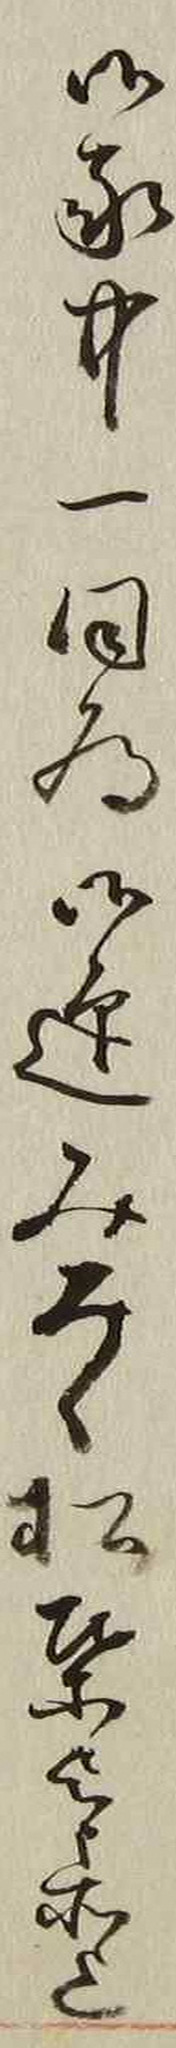御家中一同御迎え之為みろく松葉と申す所迄
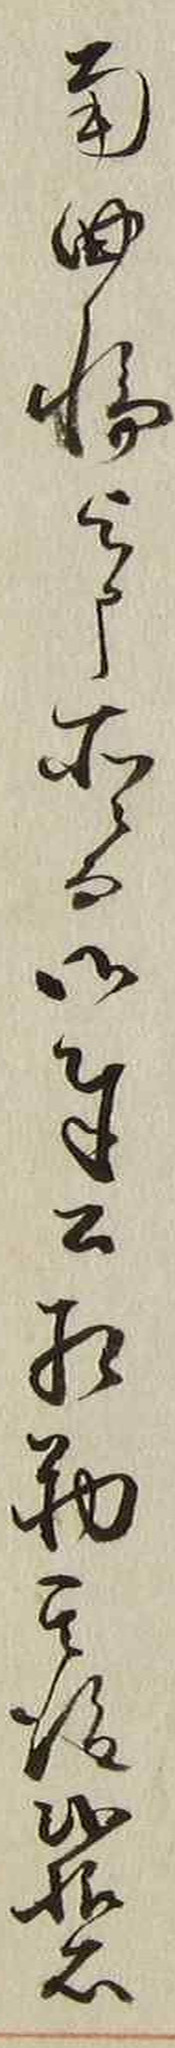南曲輪と申す所ニて御奉公相勤め其後弐拾石
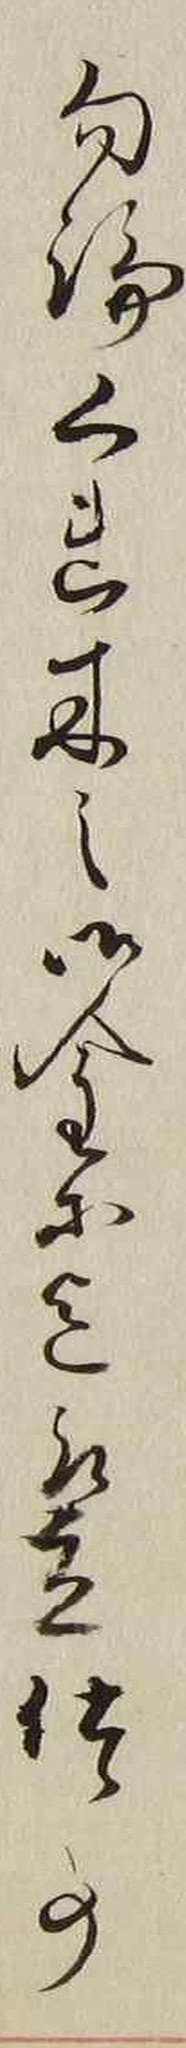勿論くれ木之御金等迄取立仕り候事
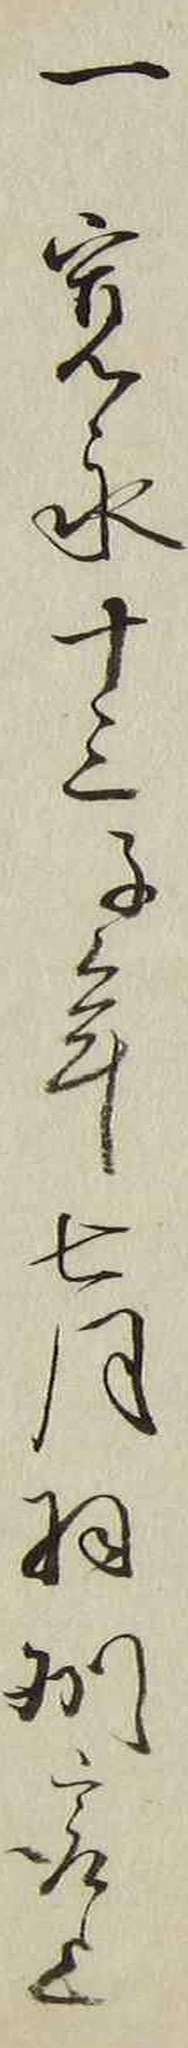一寛永十三子年七月相州最上

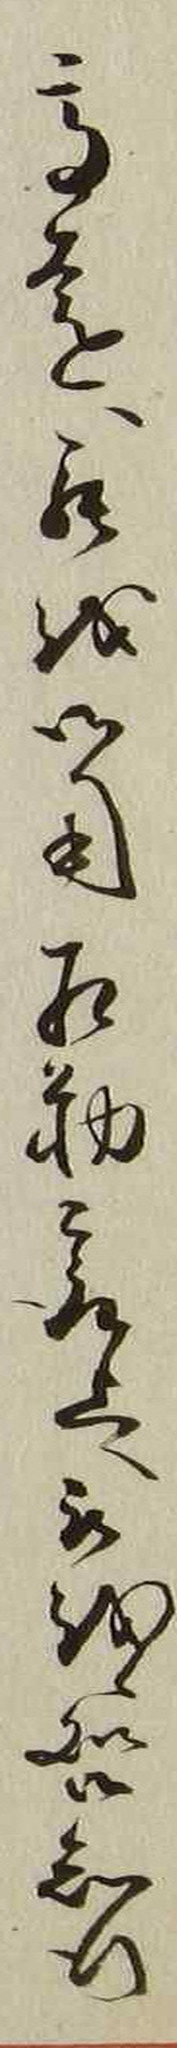高遠へ罷り越御用相勤め最上へ罷り越候処御知行
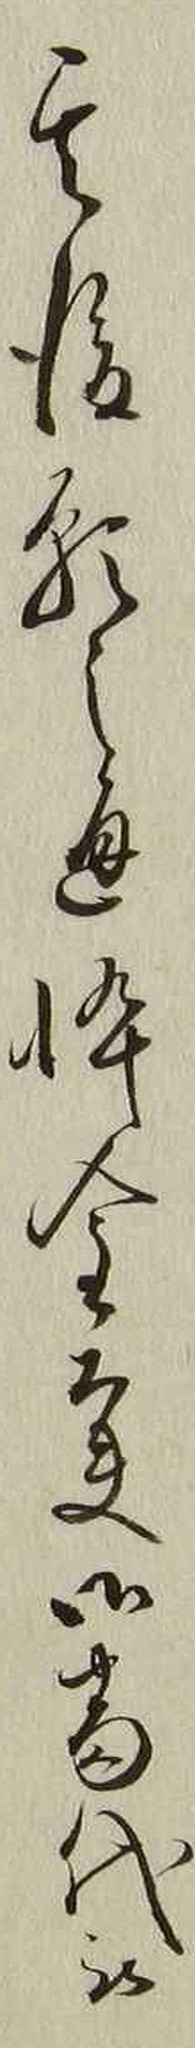其後願い之通り倅金太夫御番代
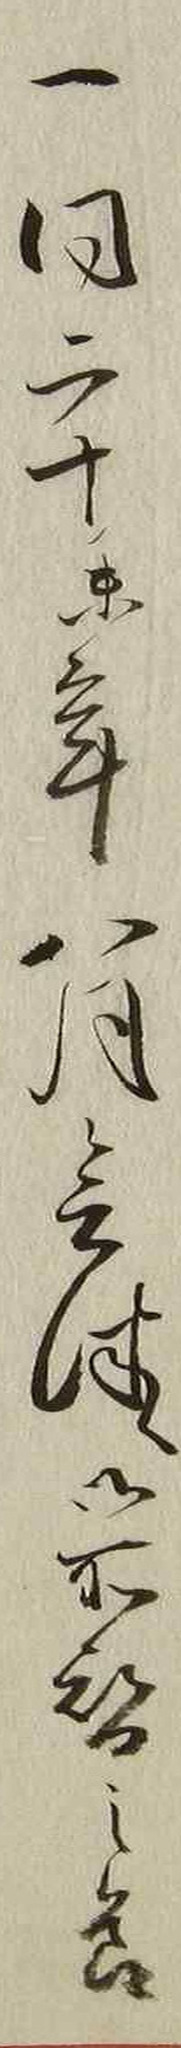一同二十未年八月会津へ御所替え之節
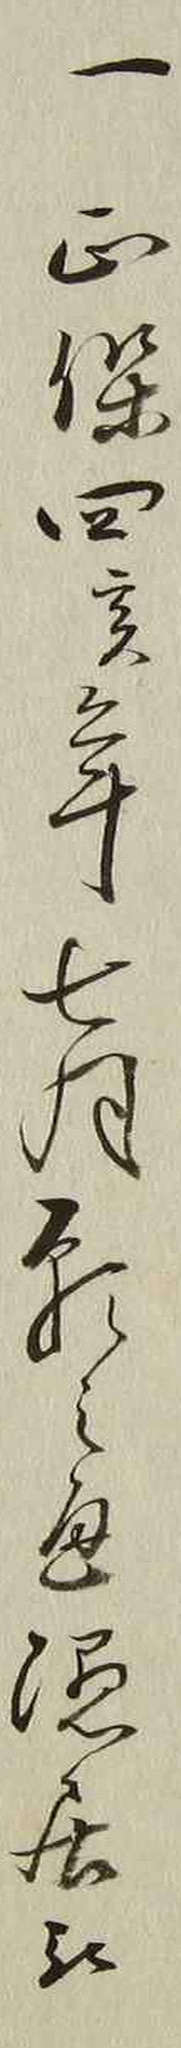一正保四亥年七月願い之通り隠居
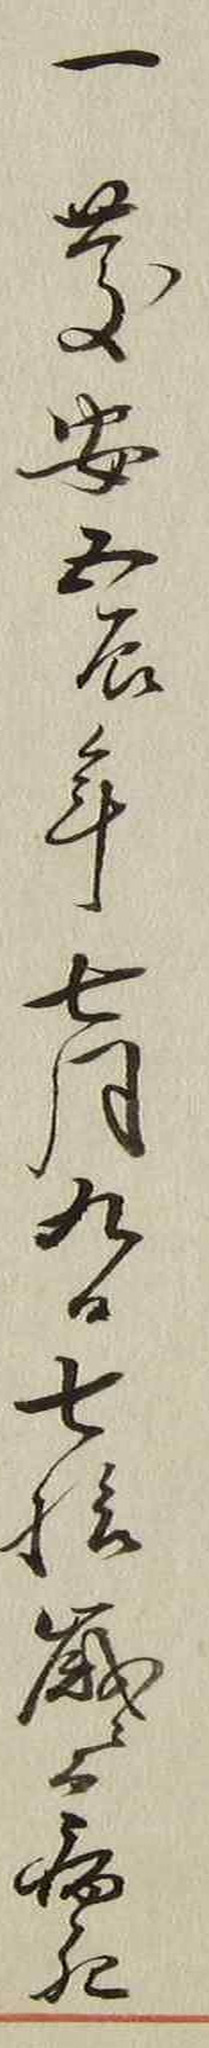一慶安五辰年七月九日七拾歳ニて病死
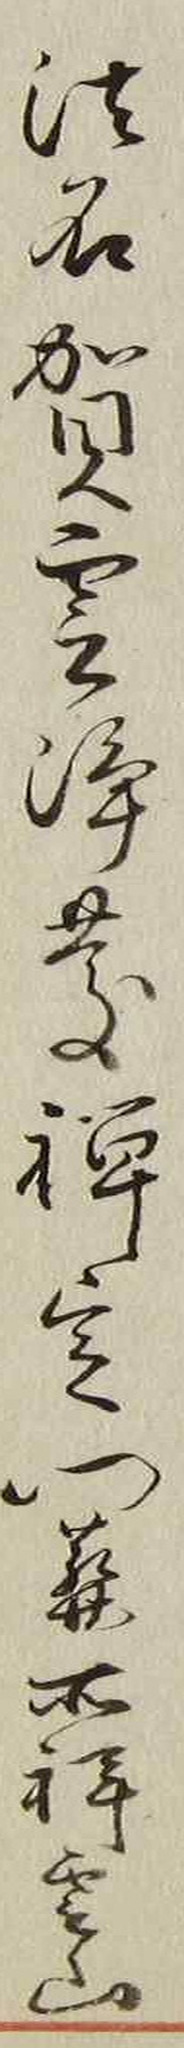法名賀雲浄慶禅定門葬所祥雲山
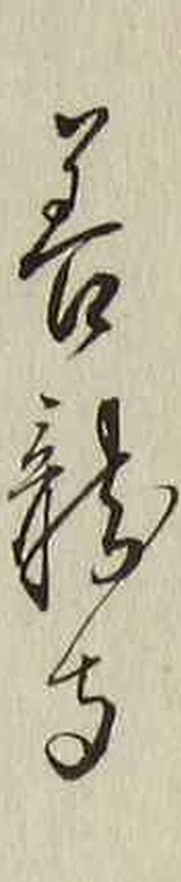善龍寺

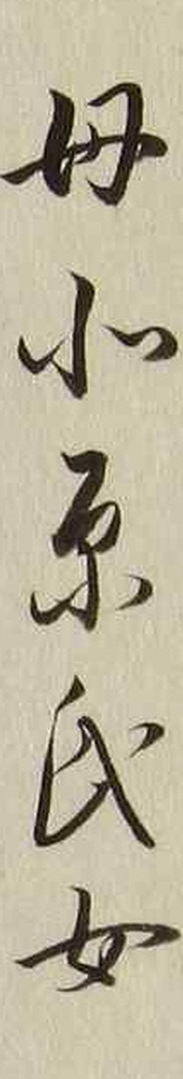母北原氏女
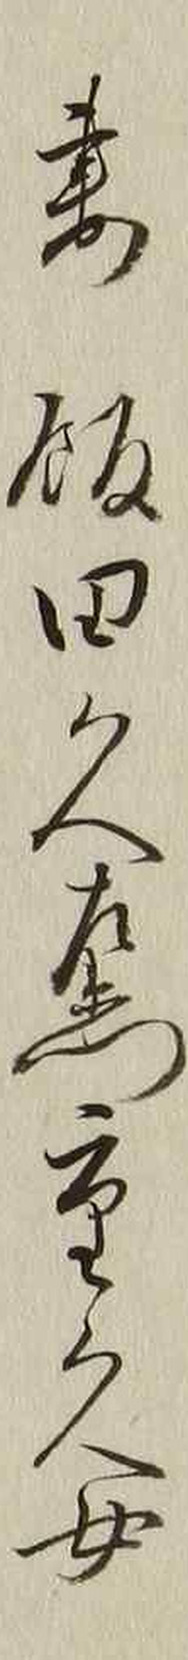妻飯田久左衛門重久女
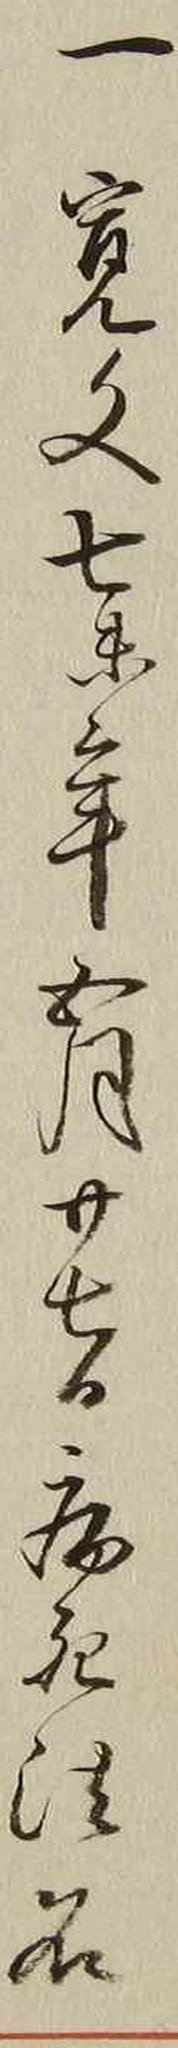一寛文七未年五月廿七日病死法名
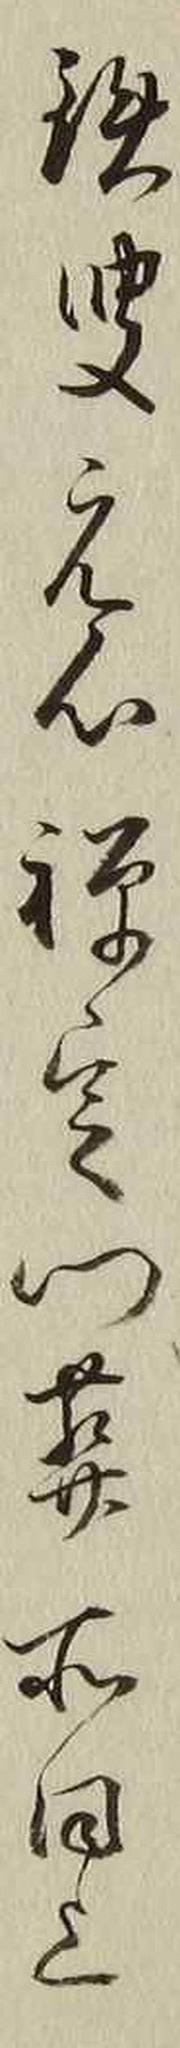鉄決元心禅定門葬所同上
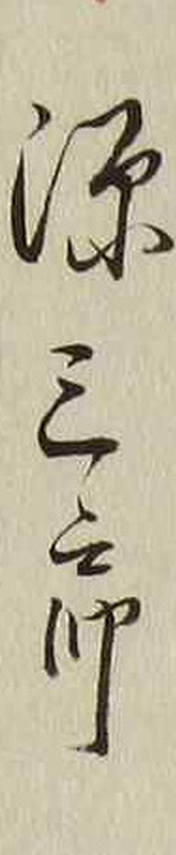源三郎
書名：諸士系譜　巻之20　い之部20
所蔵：会津若松市立会津図書館
